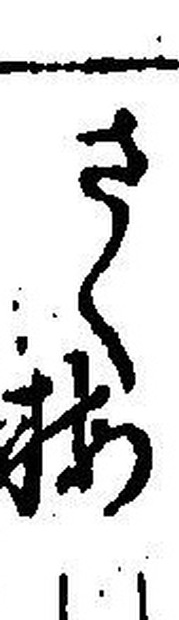さく梅
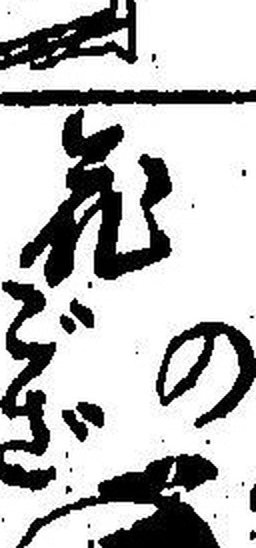花ござ
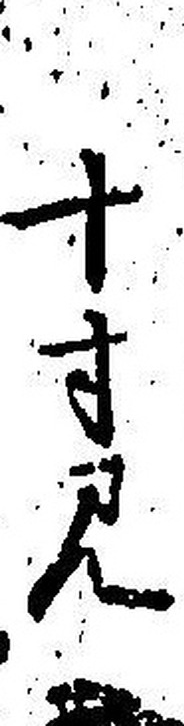十寸見
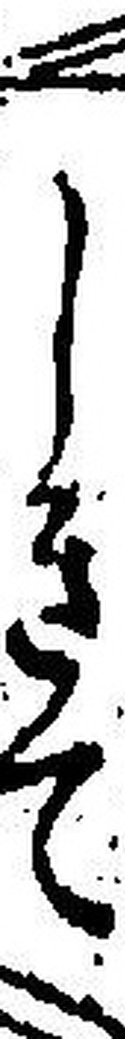しきて
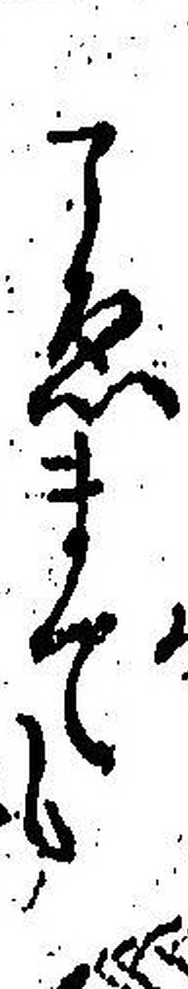こゑまても
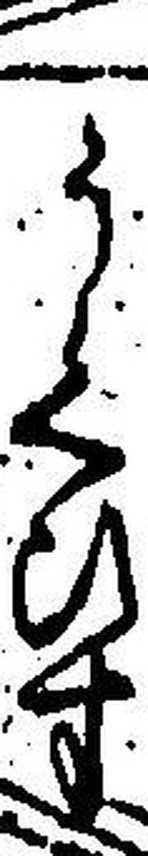うくひす
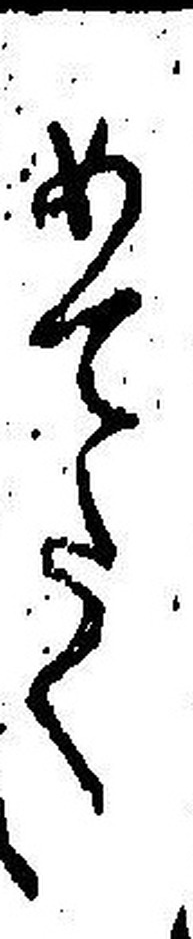めてたく
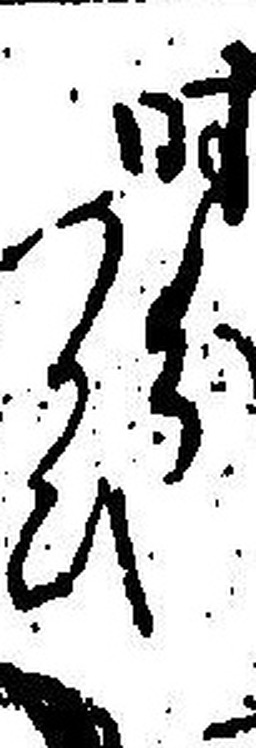つかひ
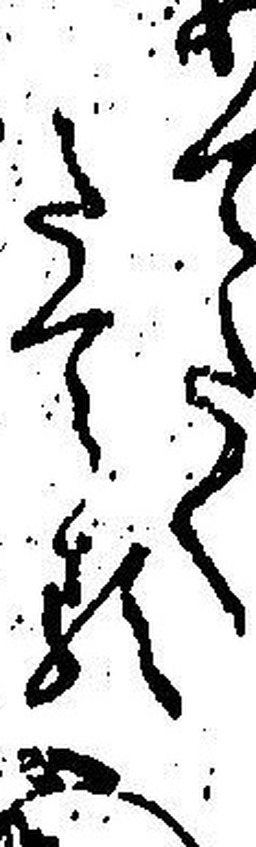たてる
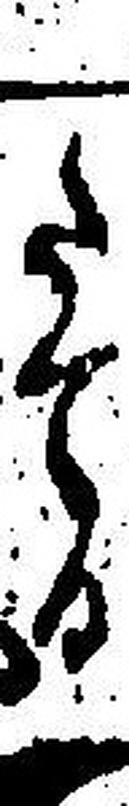たてる
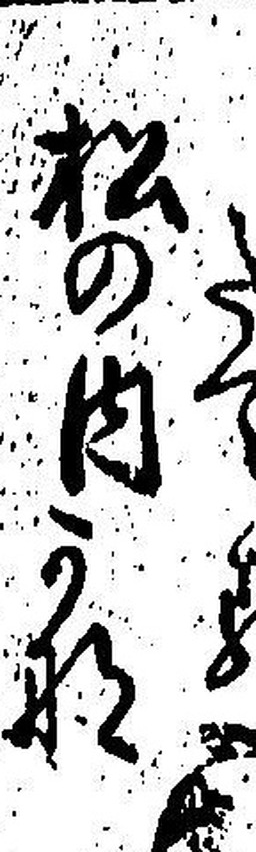松の内かな
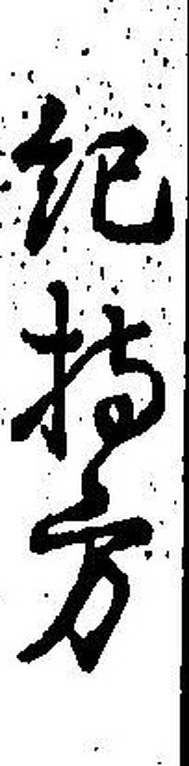紀持方
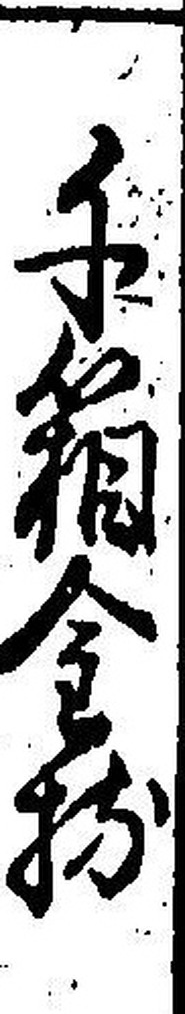千箱金持
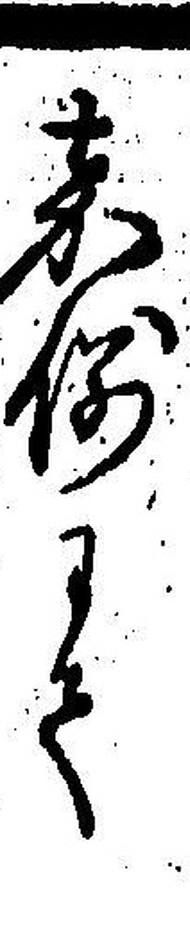嘉例にて
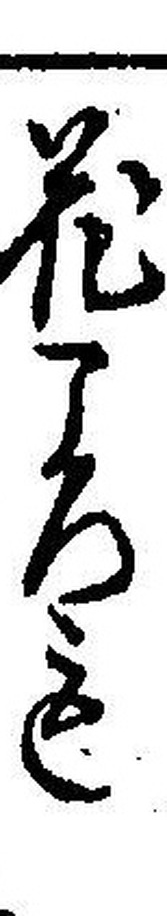花ころも
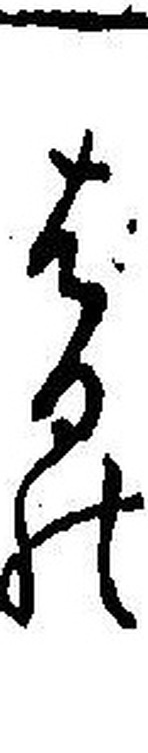はるの
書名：どうれ百人一首 / 鹿都部真顔(狂歌堂)編
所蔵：東京大学総合図書館 General Library in the University of Tokyo, JAPAN
